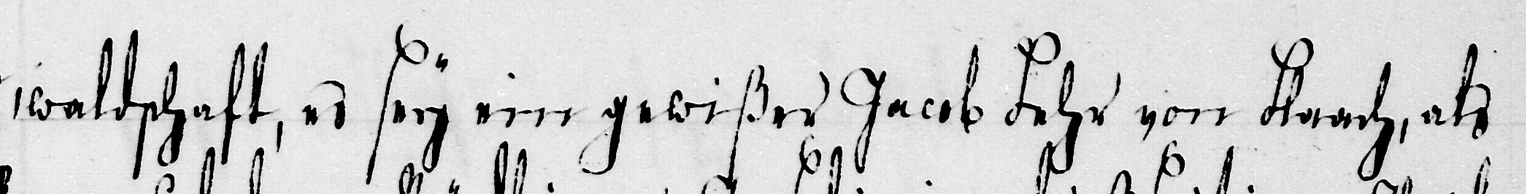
waldschaft, es sey ein gewißer Jacob Fehr von Flaach, als
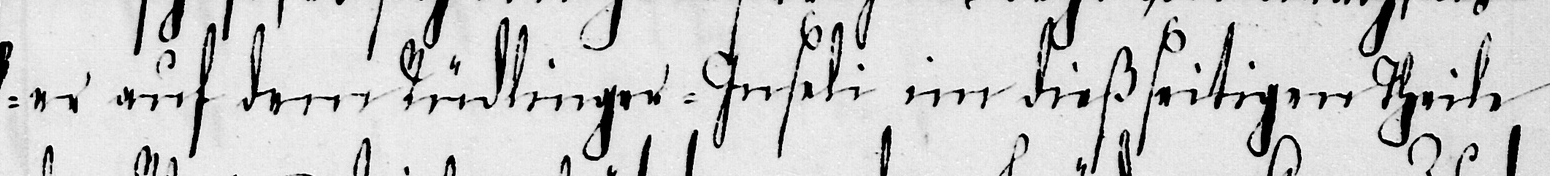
er auf dem Rüdlinger-Inseli im dießseitigen Theile
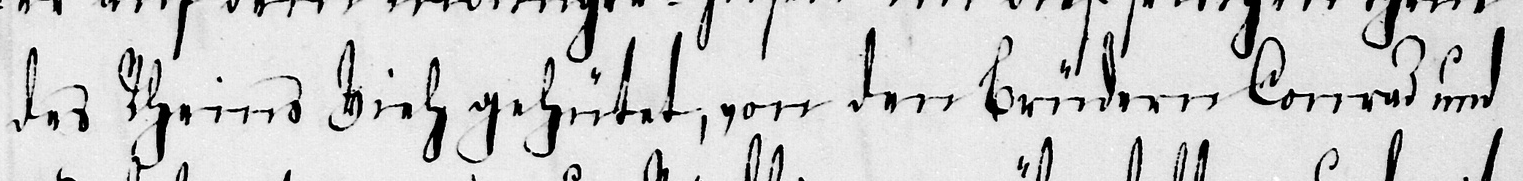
des Rheins Vieh gehütet, von den Brüdern Conrad und
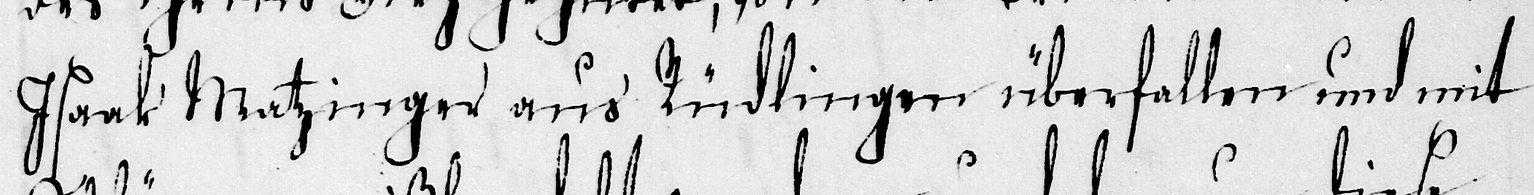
Isaak Matzinger aus Rüdlingen überfallen und mit
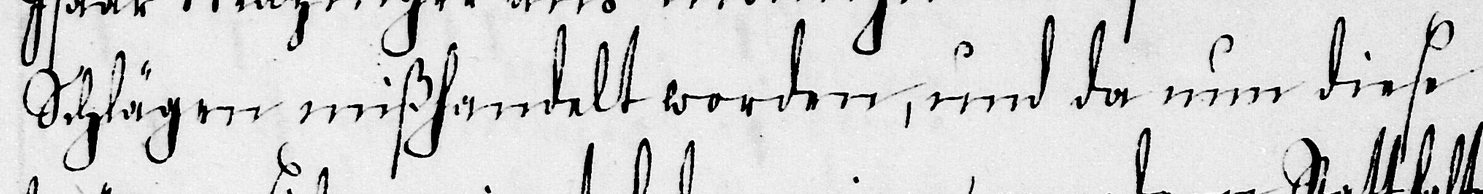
Schlägen mißhandelt worden, und da nun diese
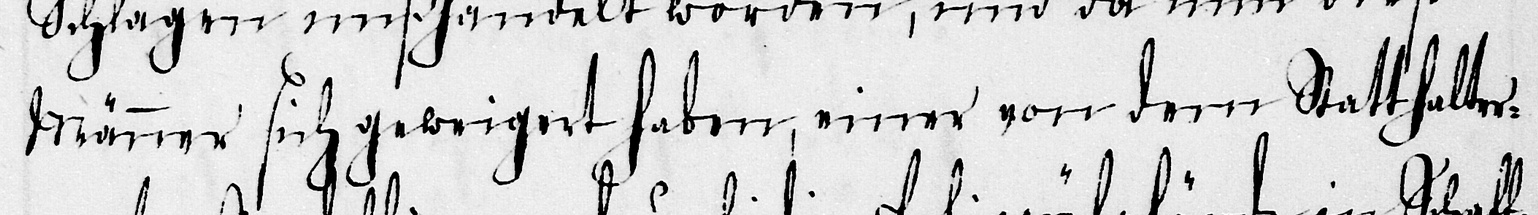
Männer sich geweigert haben, einer von dem Statthalter¬
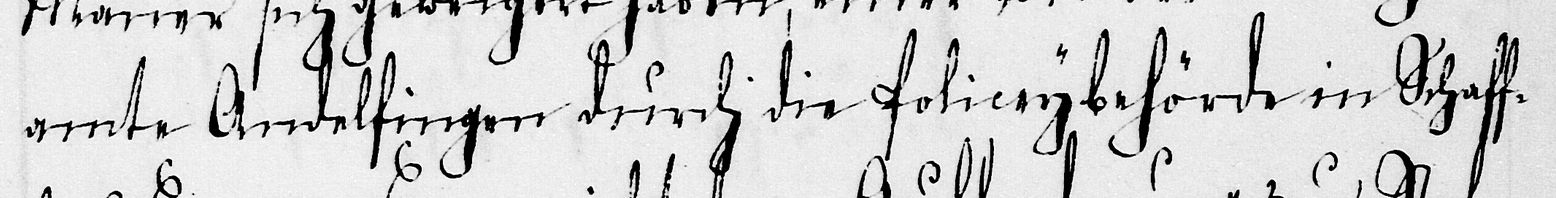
amte Andelfingen durch die Policeybehörde in Schaff¬
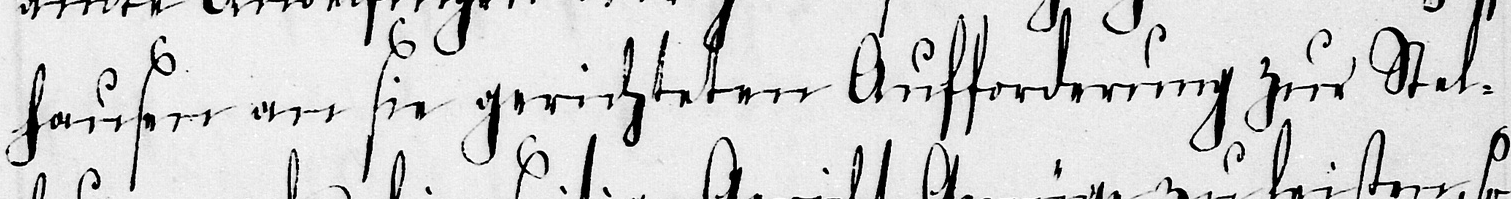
hausen an sie gerichteten Aufforderung zur Stel¬
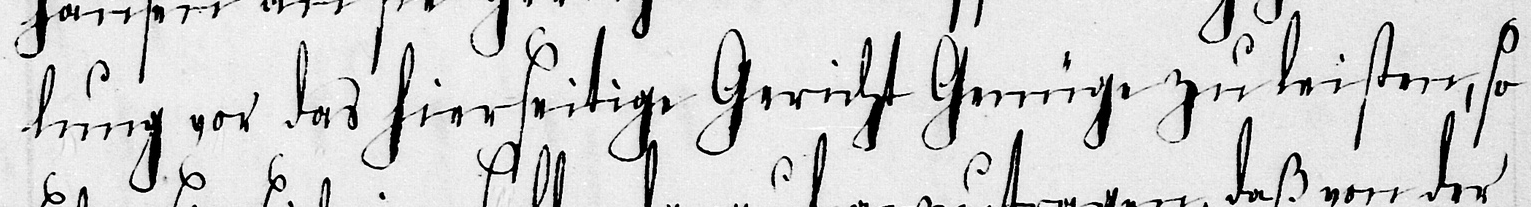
lung vor das hierseitige Gericht Genüge zu leisten, so
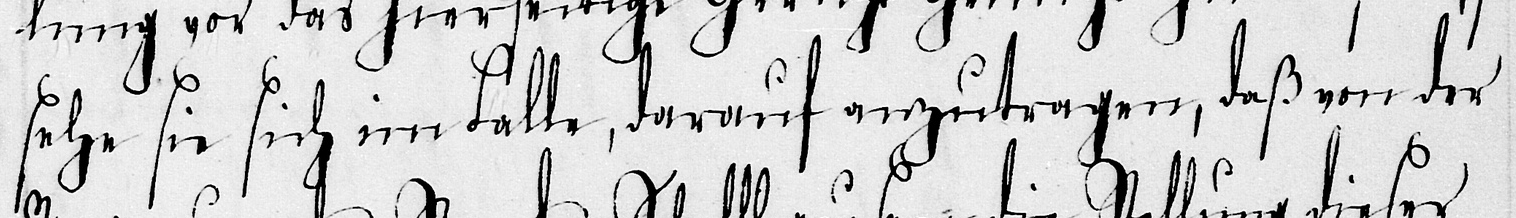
sehe sie sich im Falle, darauf anzutragen, daß von der
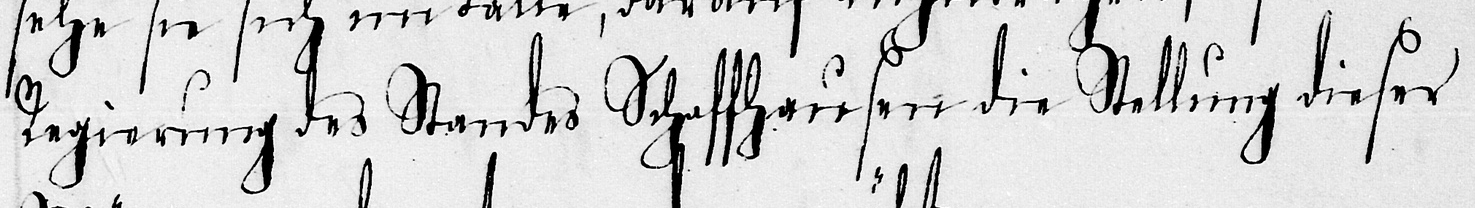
Regierung des Standes Schaffhausen die Stellung dieser
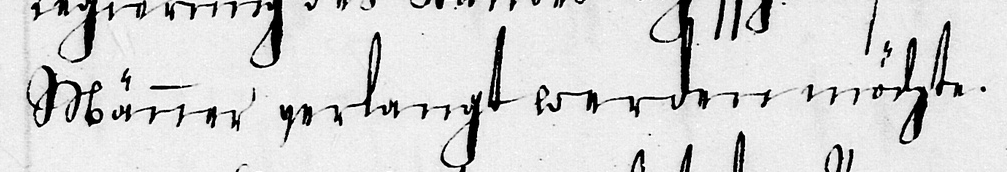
Männer verlangt werden möchte.
